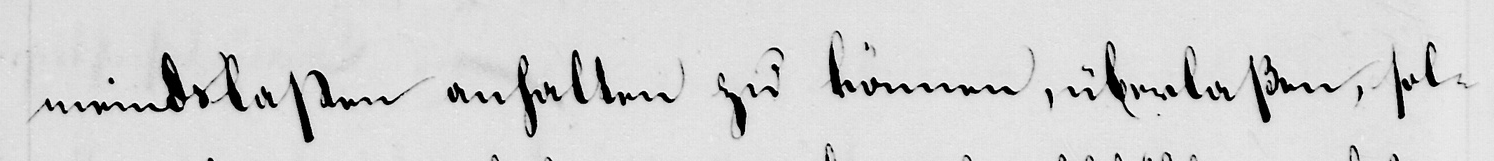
meindslasten anhalten zu können, überlaßen, sol¬
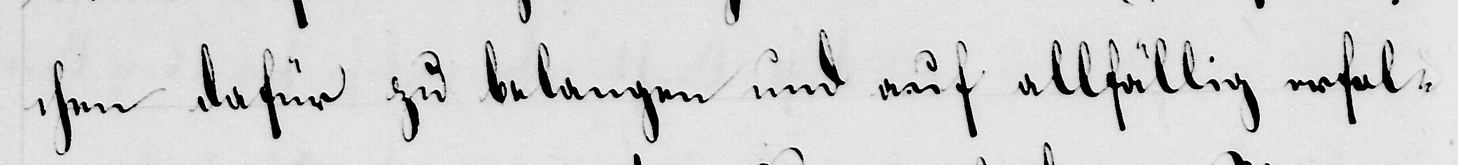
chen dafür zu belangen und auf allfällig erfol¬
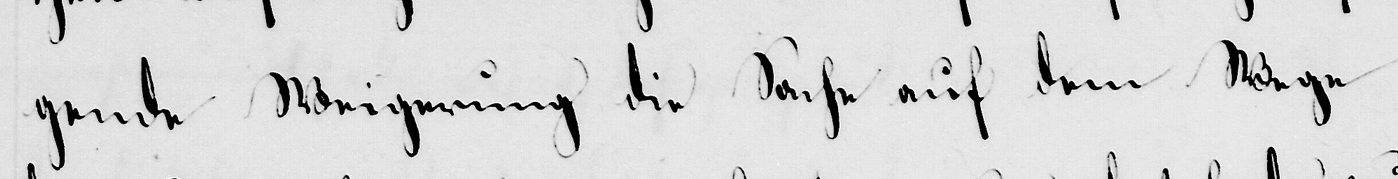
gende Weigerung die Sache auf dem Wege
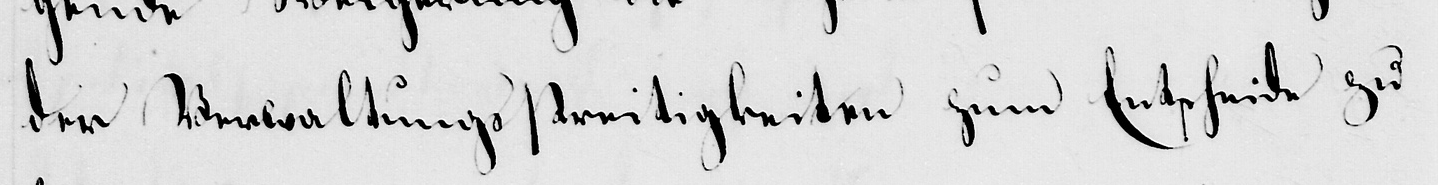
der Verwaltungsstreitigkeiten zum Entscheide zu
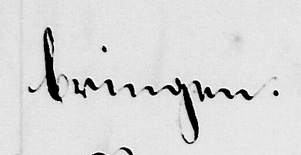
bringen.
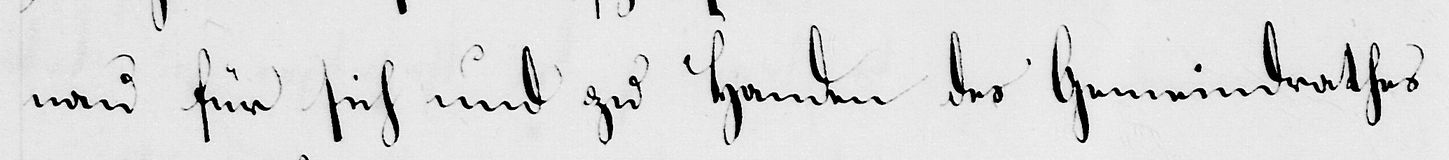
nau für sich und zu Handen des Gemeindrathes
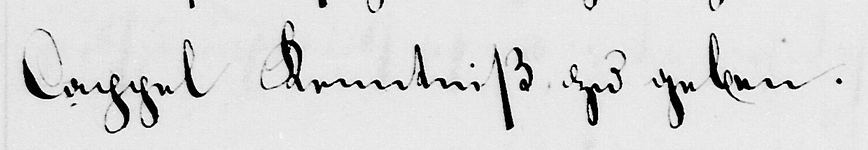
Cappel Kenntniß zu geben.
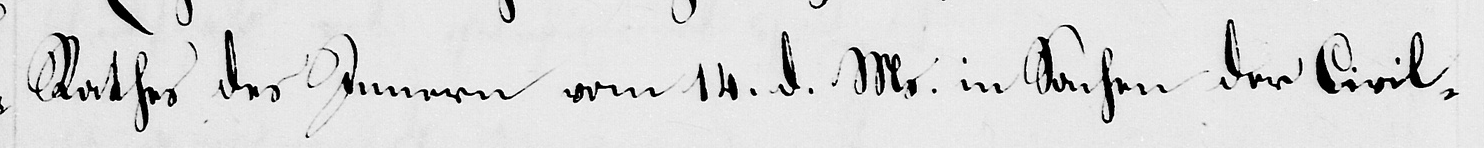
Rathes des Innern vom 14. d. Ms. in Sachen der Civil¬
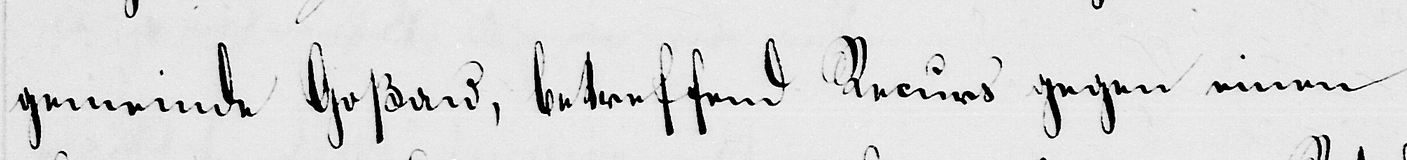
gemeinde Goßau, betreffend Recurs gegen einen
